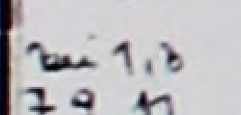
zu 1, 3
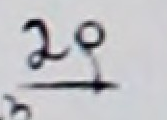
29
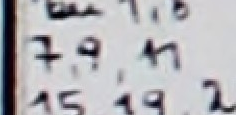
7, 9, 11
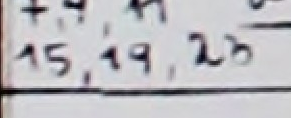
15, 19, 23
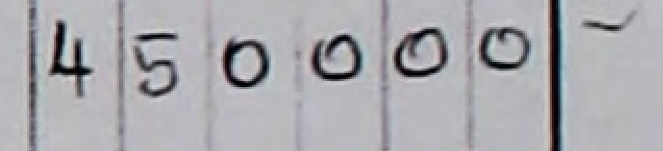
450000
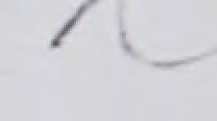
12
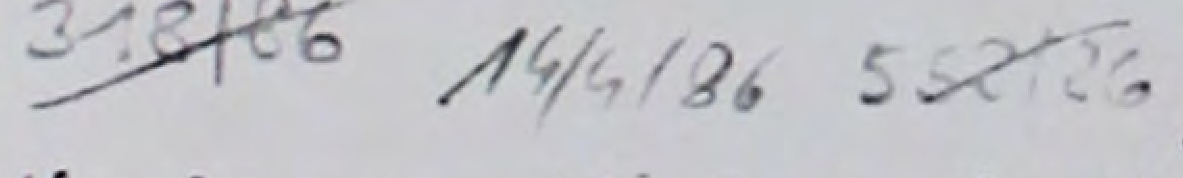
318/86 14/4/86 552/26
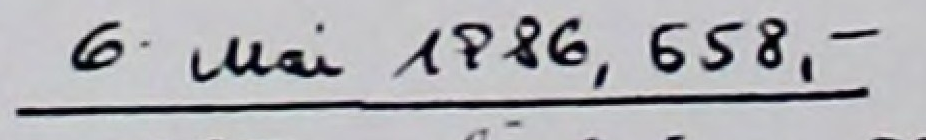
6. Mai 1986, 658,-
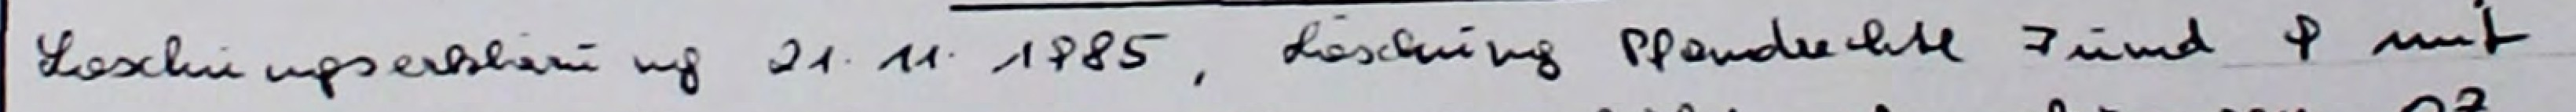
Löschungserklärung 21.11.1985, Löschung Pfandrechte F und P mit
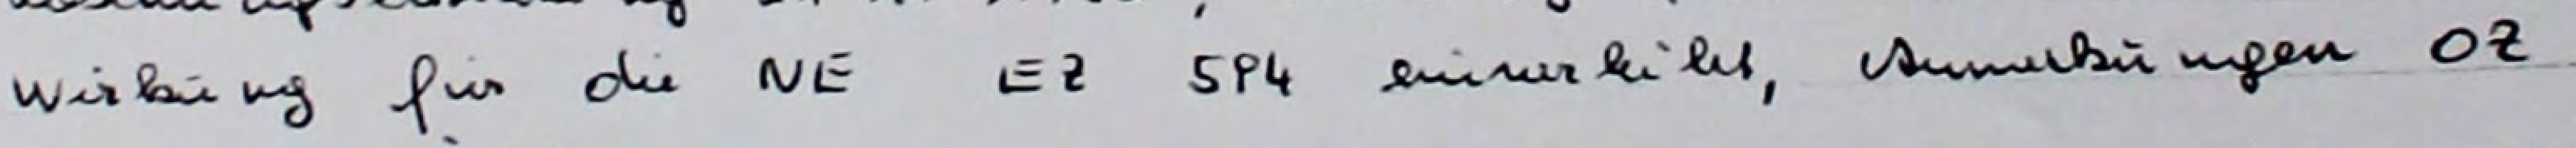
Wirkung für due NE EZ 5P4 einverleibt, Anmerkungen OZ
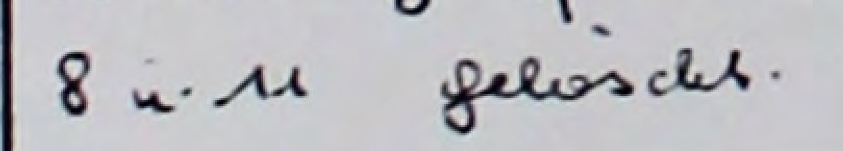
8 u. 11 gelöscht.
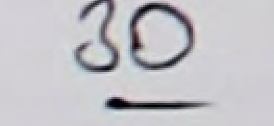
30
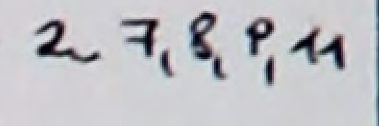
zu 7, 8, 9, 11
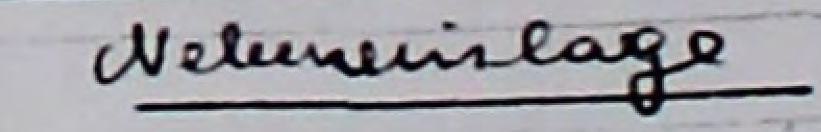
Nebeneinlage
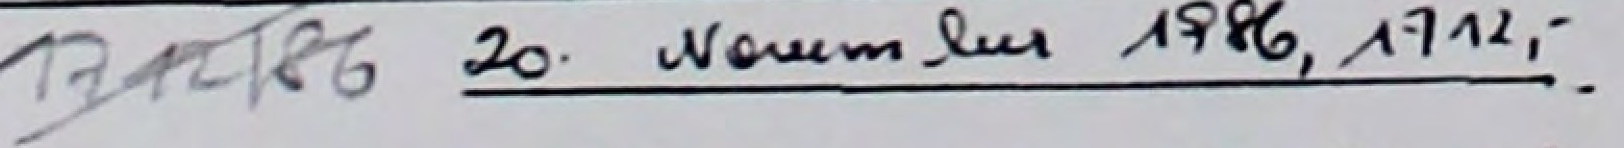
1712/86 20. November 1986, 1712,-
